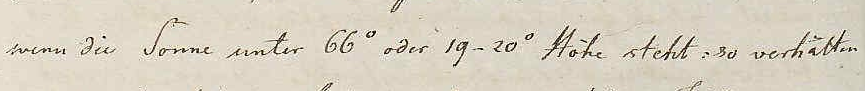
wenn die Sonne unter 66° oder 19–20° Höhe steht: so verha¨lten
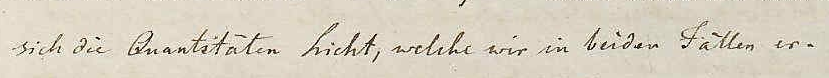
sich die Quantitäten Licht, welche wir in beiden Fällen er-
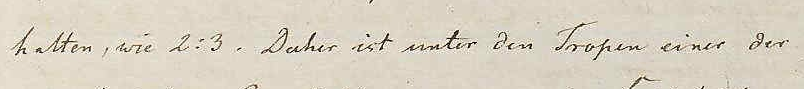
halten, wie 2:3. Daher ist unter den Tropen einer der
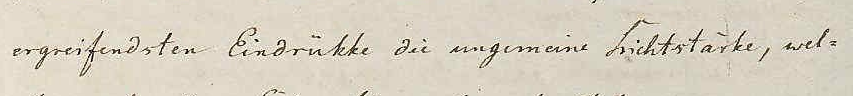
ergreifendsten Eindrükke die ungemeine Lichtstärke, wel-
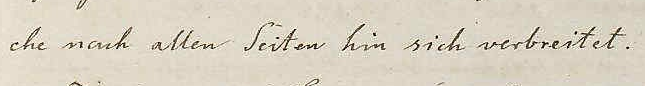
che nach allen Seiten hin sich verbreitet.
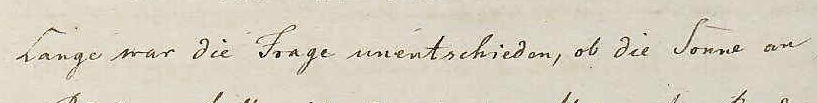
Lange war die Frage unentschieden, ob die Sonne an
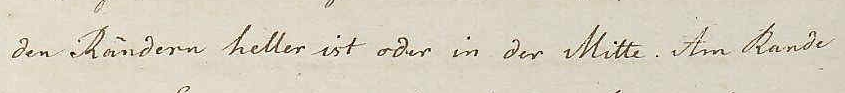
den Rändern heller ist oder in der Mitte. Am Rande
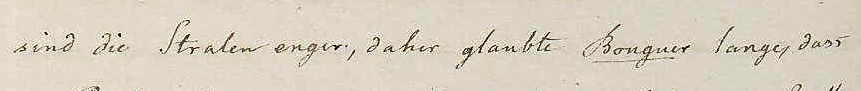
sind die Stralen enger, daher glaubte Bouguer lange, dass
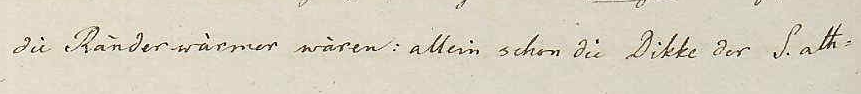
die Ränder wärmer wären: allein schon die Dikke der S.ath-
